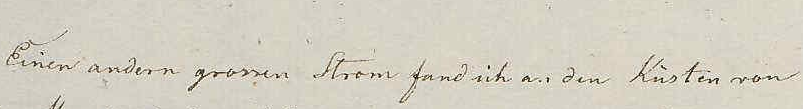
Einen andern grossen Strom fand ich an den Küsten von
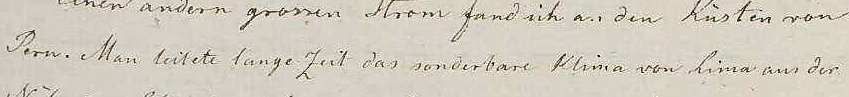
Peru. Man leitete lange Zeit das sonderbare Klima von Lima aus der
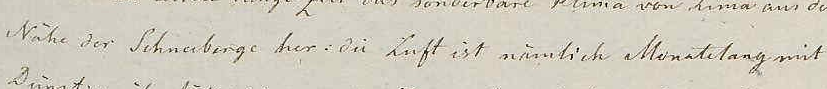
Nähe der Schneeberge her: die Luft ist nämlich Monatelang mit
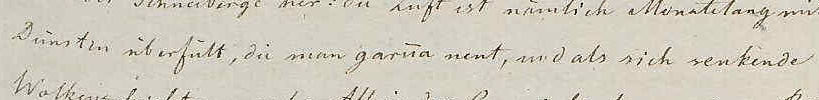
Dünsten überfült, die man garūa nent, und als sich senkende
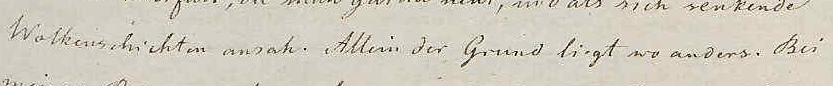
Wolkenschichten ansah. Allein der Grund liegt wo anders. Bei
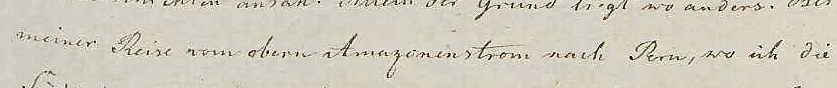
meiner Reise vom obern Amazonenstrom nach Peru, wo ich die
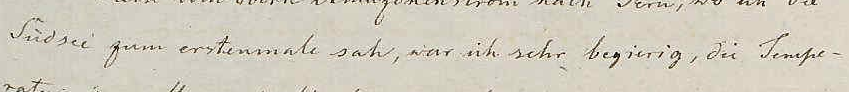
Südsee zum erstenmale sah, war ich sehr begierig, die Tempe-
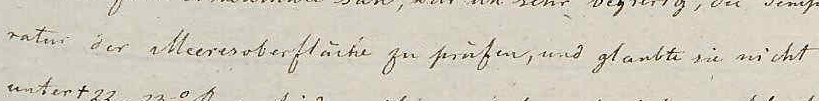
ratur der Meeresoberfläche zu prüfen, und glaubte sie nicht
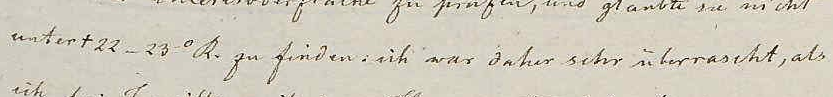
unter +22–23° R. zu finden: ich war daher sehr überrascht, als
